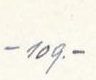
109
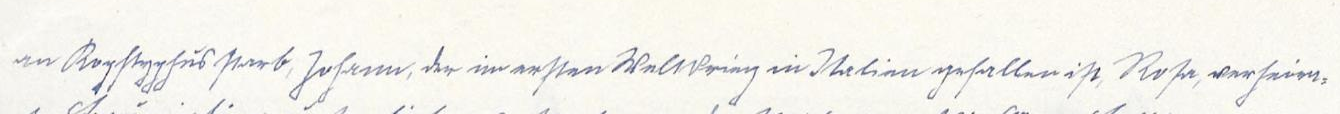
an Kopftyphus starb. Johann, der im ersten Weltkrieg in Italien gefallen ist. Rosa, verheira-
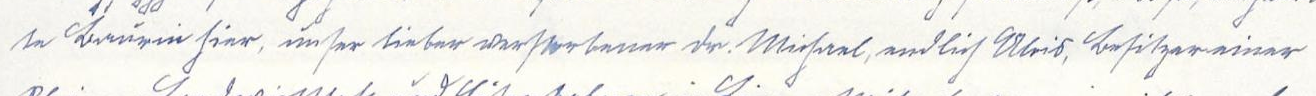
ten Bäuerin hier, unser lieber verstorbener Dr. Michael, endlich Alois, Besitzer einer
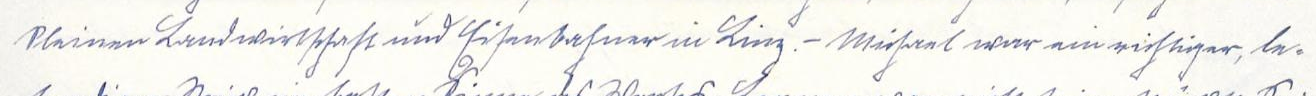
kleinen Landwirtschaft und Eisenbahner in Linz. Michael war ein richtiger, le-
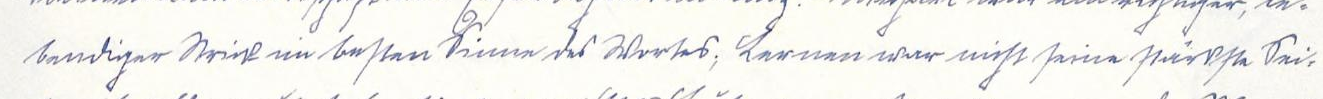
bendiger Strick im besten Sinne des Wortes, Lernen war nicht seine stärkste Sei-
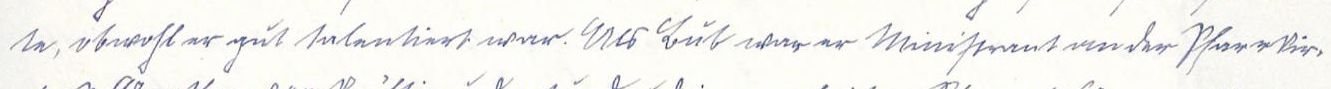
te, obwohl er gut talentiert war. Als Bub war er Ministrant an der Pfarrkir-
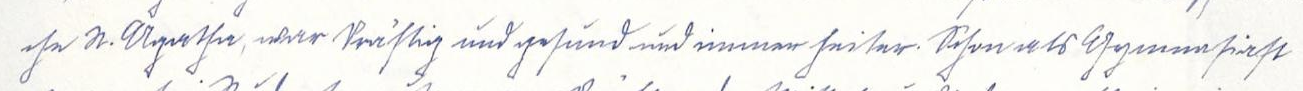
che St. Agatha, war kräftig und gesund und immer heiter. Schon als Gymnasiast
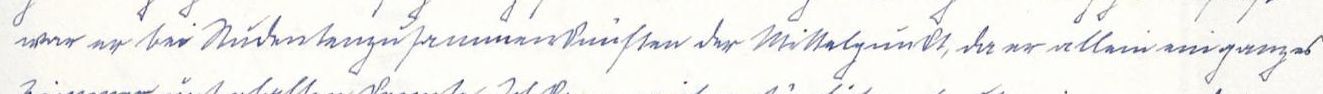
war er bei Studentenzusammenkünften der Mittelpunkt, der er allein ein ganzes
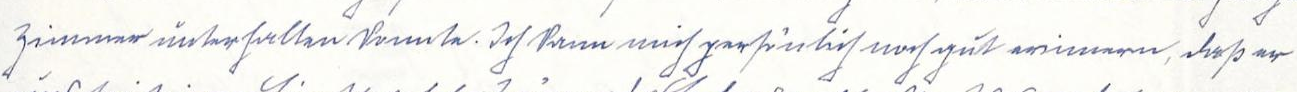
Zimmer unterhalten konnte. Ich kann mich persönlich noch gut erinneren, dass er
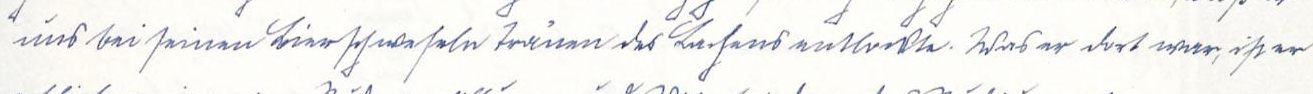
uns bei seinen Bierschwesele Tränen des Lachens entlockte. Was er dort war, ist er
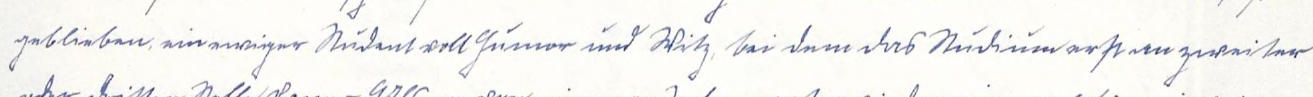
geblieben, ein ewiger „Student voll Humor und Witz bei dem das Studium erst an zweiter
